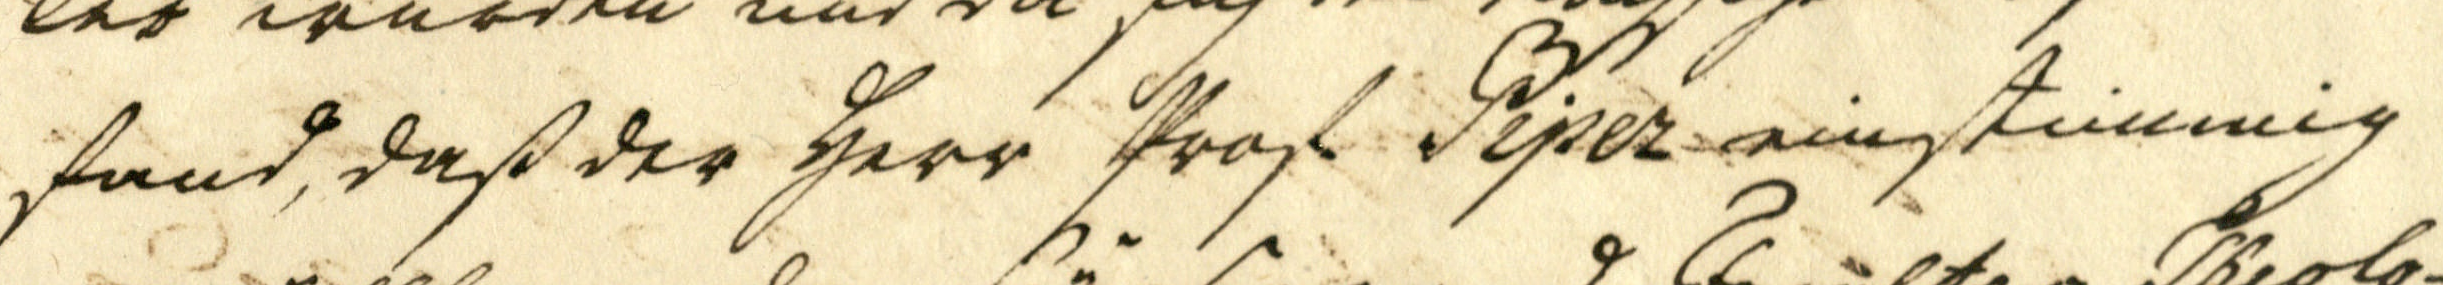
fand, daß der Herr Prof. Piper einstimmig
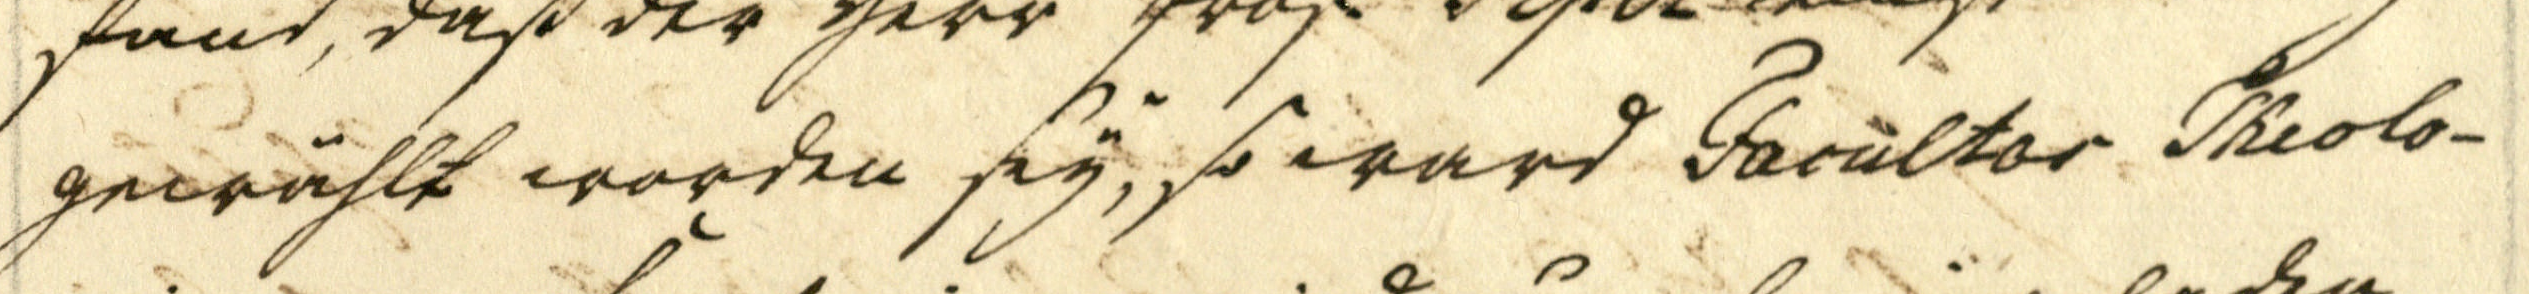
gewählt worden seÿ, so ward Facultos Theolo¬
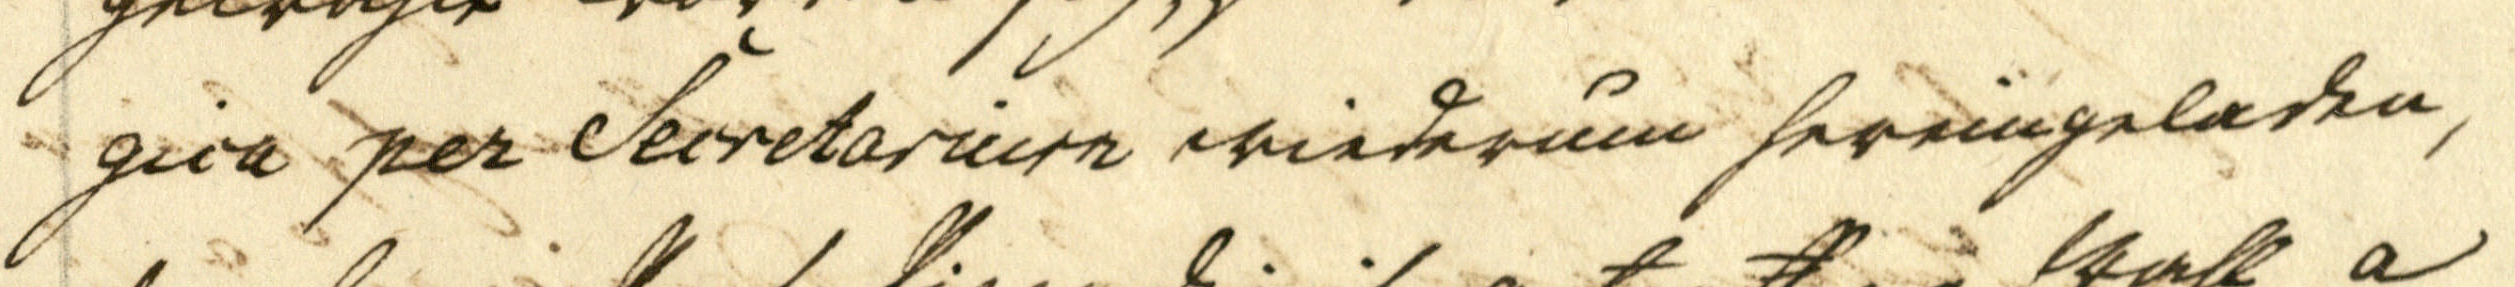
gica per Secretarium wiederum hereingeladen,
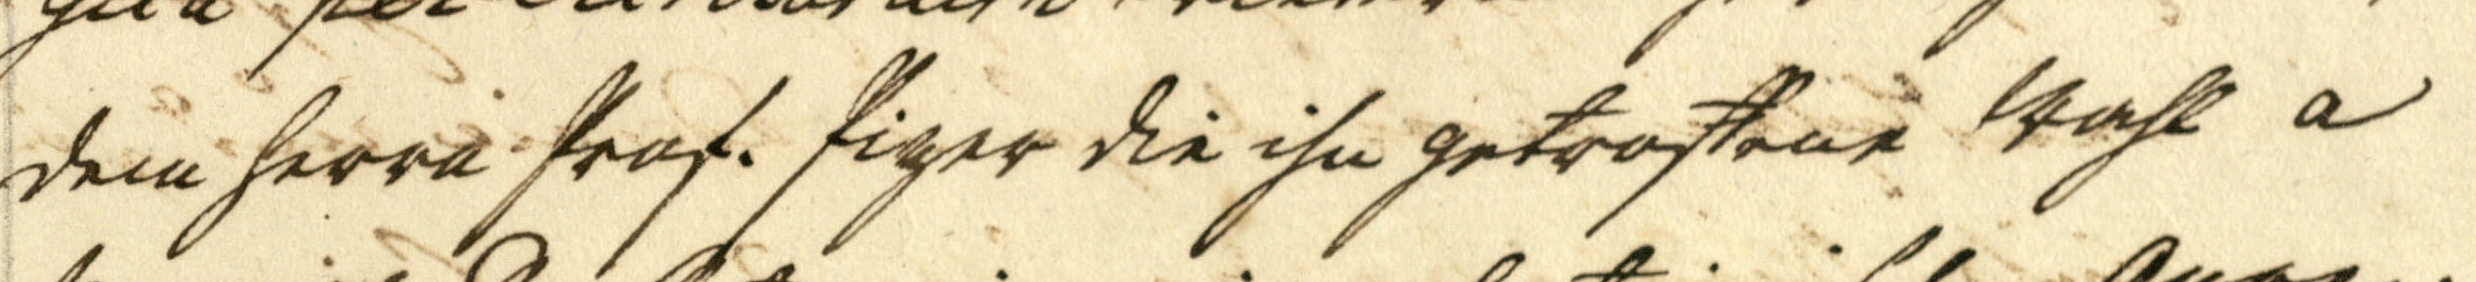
dem Herrn Prof. Piper die ihn getroffene Wahl a
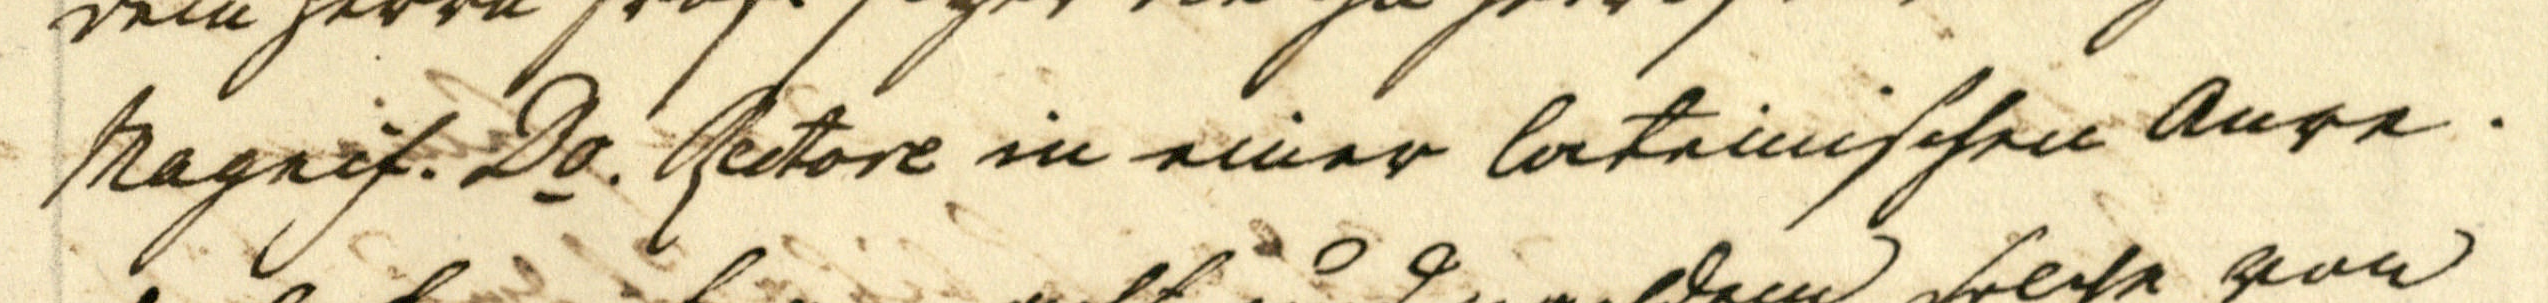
Magnif. Dn. Rectore in einer lateinischen Anre¬
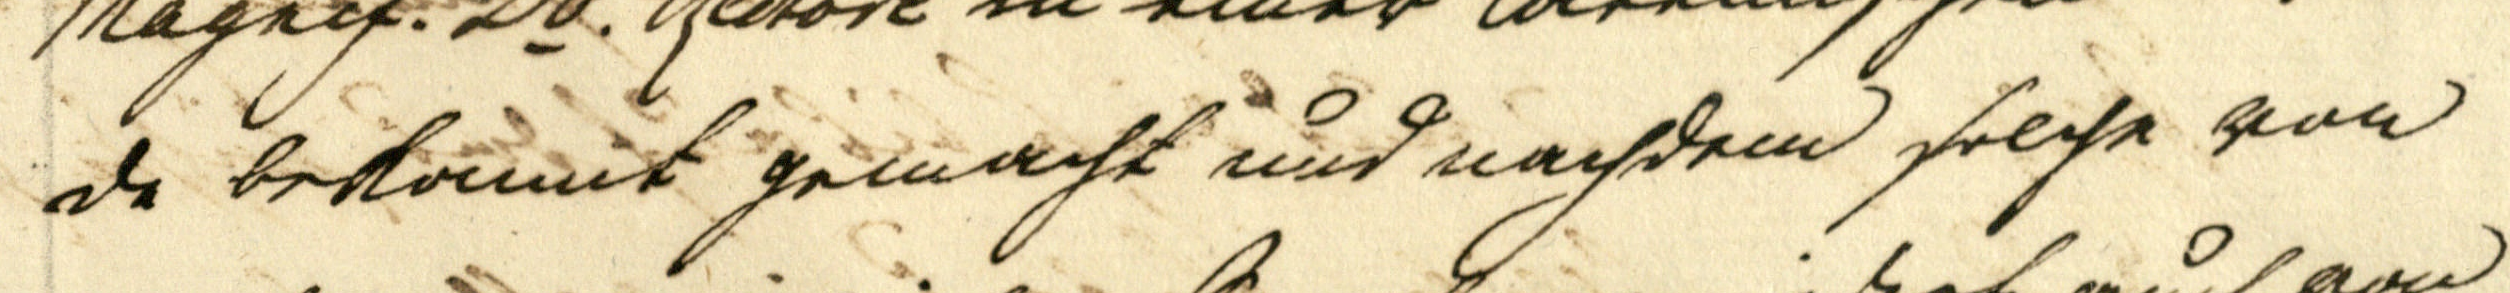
de bekannt gemacht und nachdem solche von
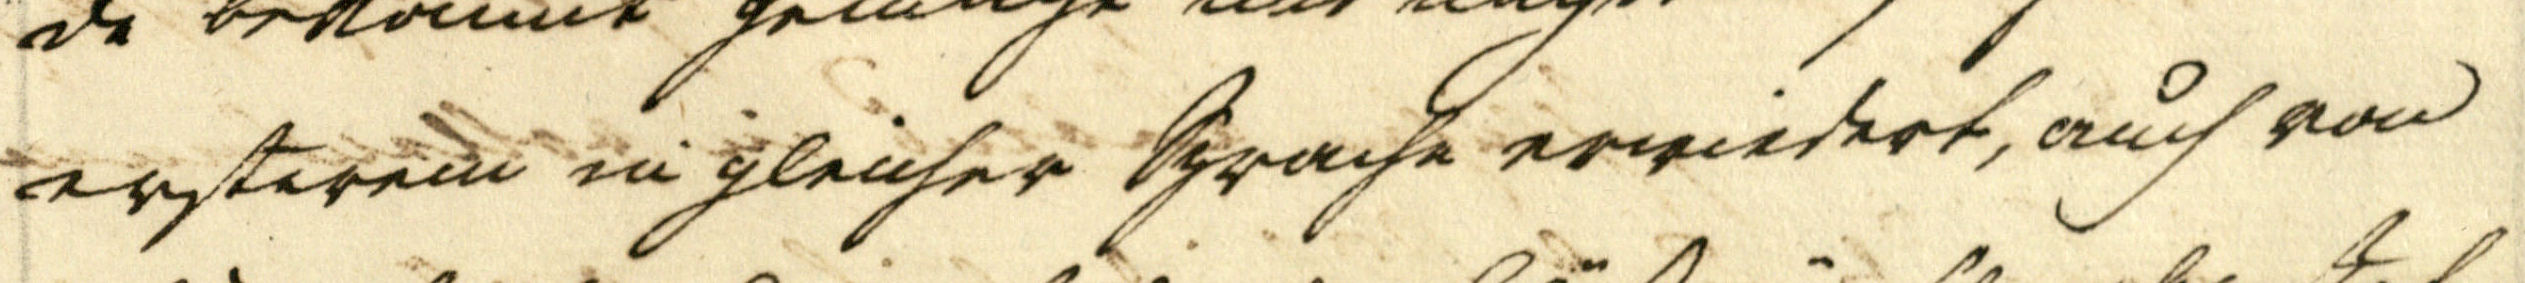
ersterem in gleicher Sprache erwiedert, auch von
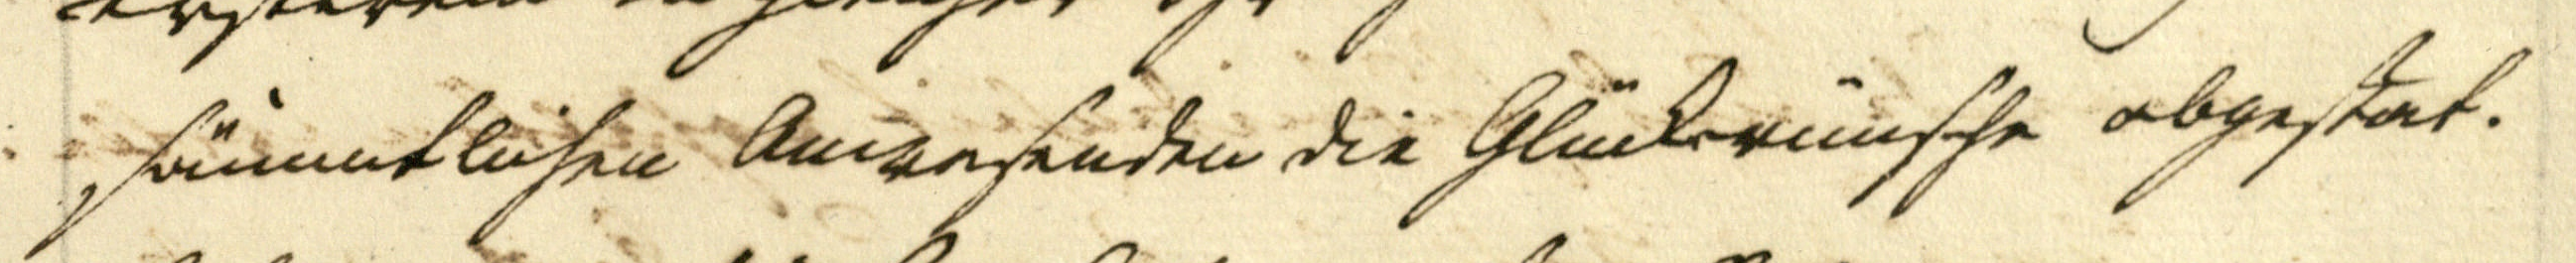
sämmtlichen Anwesenden die Glückwünsche obgestat¬
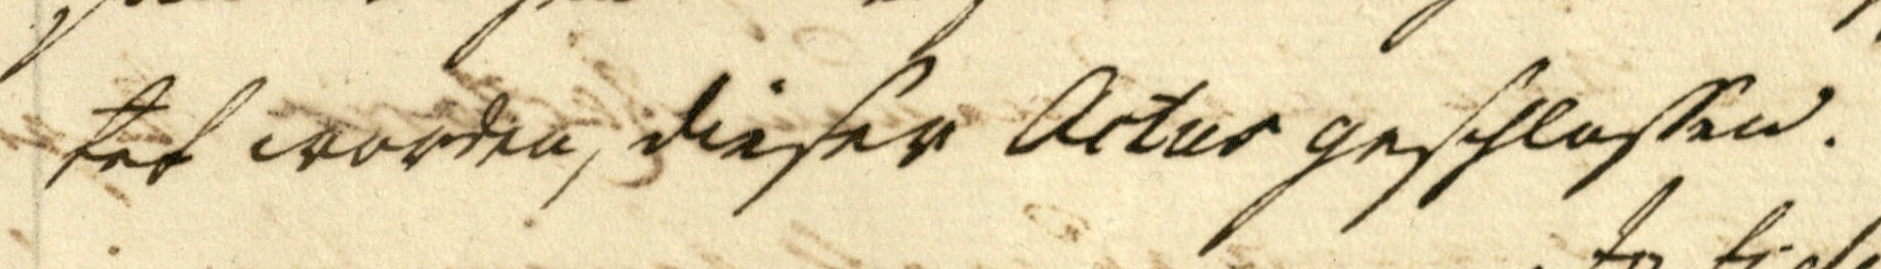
tet worden, dieser Actus geschlossen.
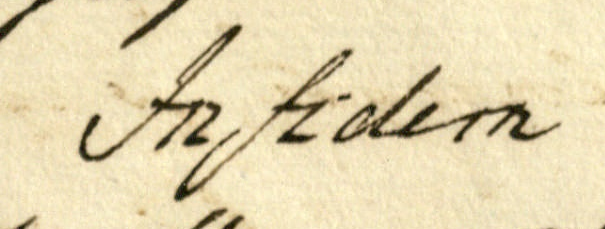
In fidem
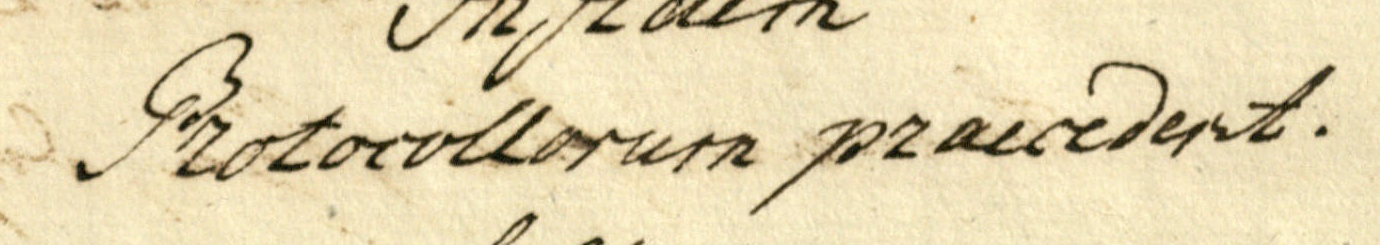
Protocollorum paecedent.
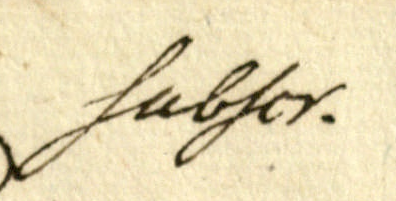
subscr.
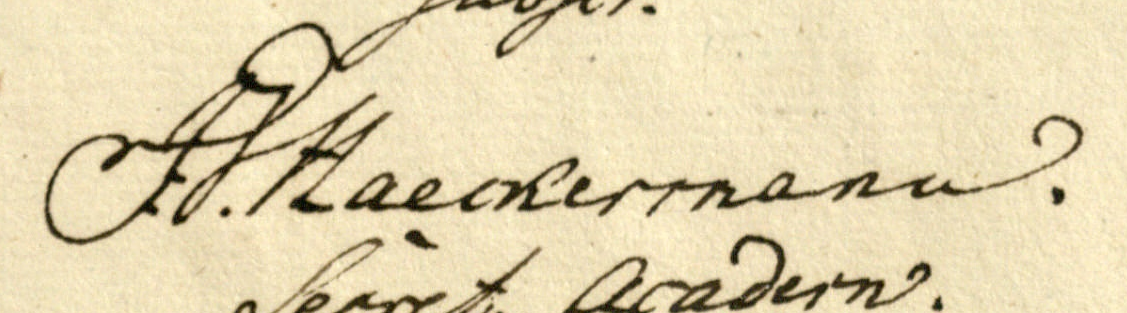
J.G. Haeckermann.
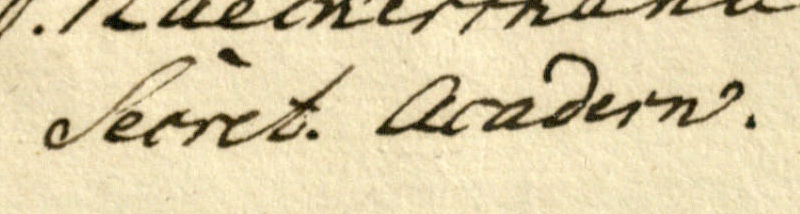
Secret. Academ.
